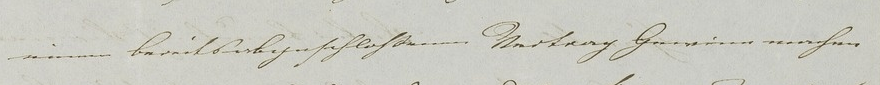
einem bereits abgeschloßenen Vertrag Gewinn machen
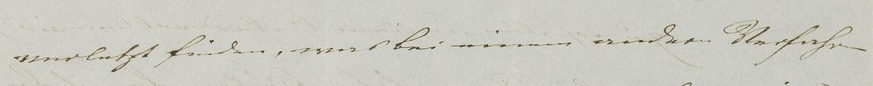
verletzt finden, was bei einem andern Verfahren
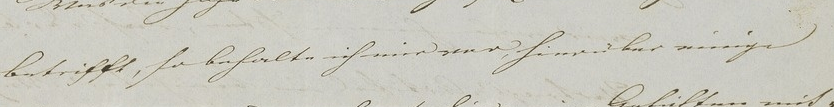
betrifft, so behalte ich mir vor, hierüber einige
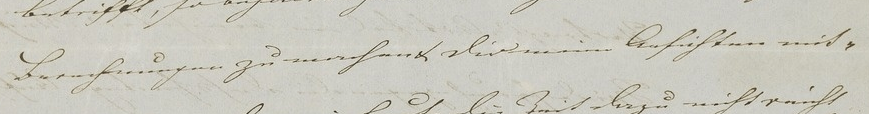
Berechnungen zu machen & Dir meine Ansichten mit-
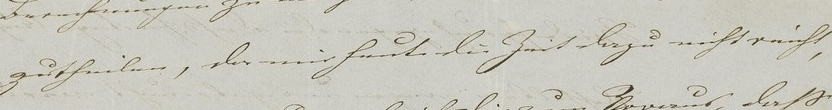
zutheilen, da mir heute die Zeit dazu nicht reicht,
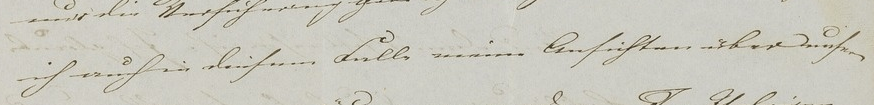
ich auch in diesem Falle meine Ansichten über unsere
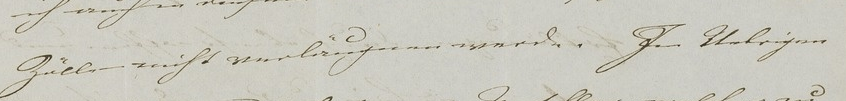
Zölle – nicht verläugnen werde. Im Uebrigen
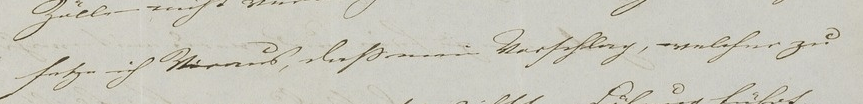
setze ich Voraus, daß mein Vorschlag, welcher zu
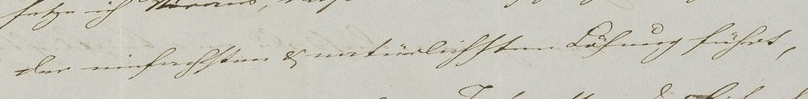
der einfachsten & natürlichsten Lösung führt,
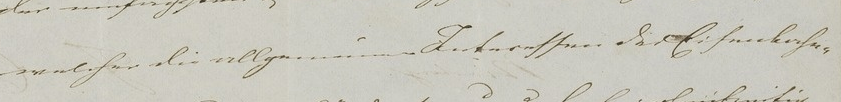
welcher die allgemeinen Interessen der Eisenbahn-
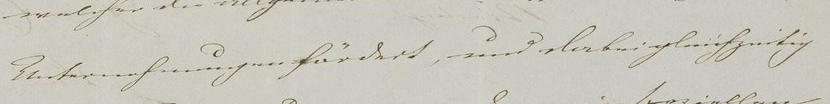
Unternehmungen fördert, und dabei gleichzeitig
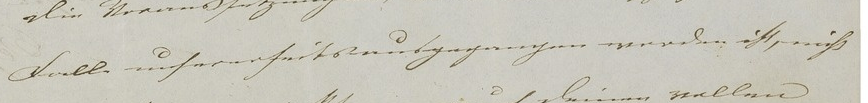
Falle unsererseits ausgegangen worden ist, nicht
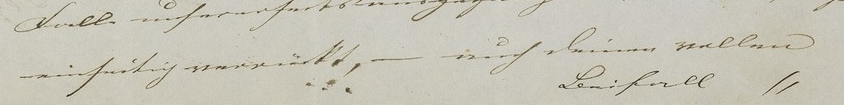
einseitig verrückt, – auch deinen vollen
